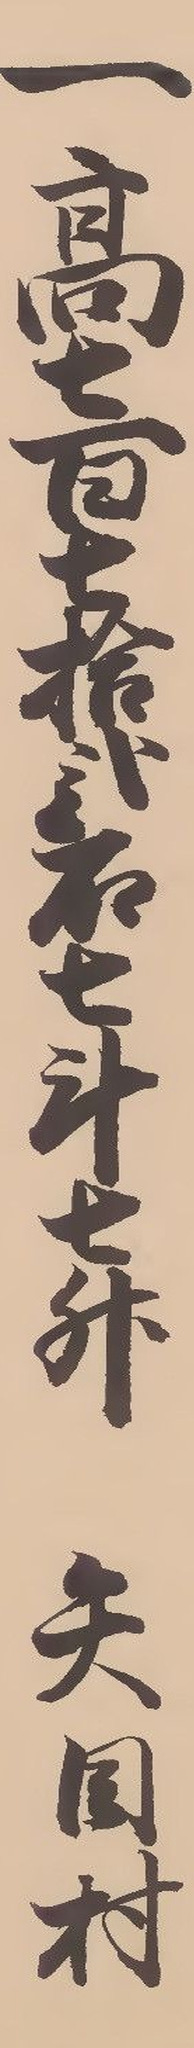一高七百七拾弐石七斗七升矢目村
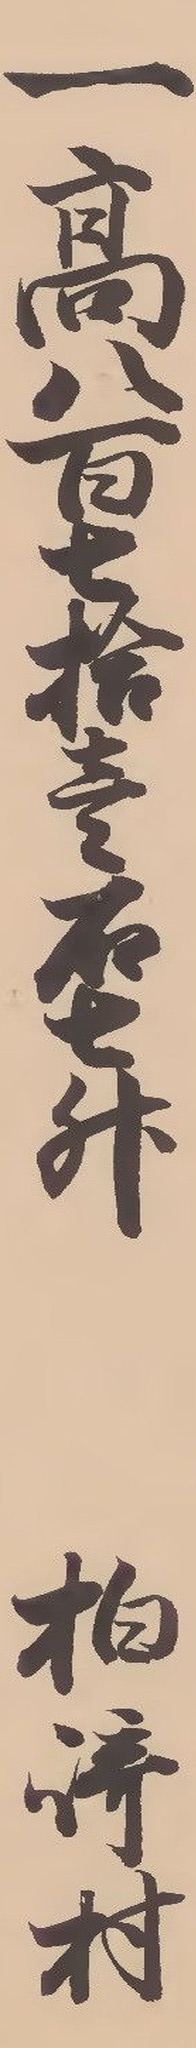一高八百七拾壱石七升柏崎村
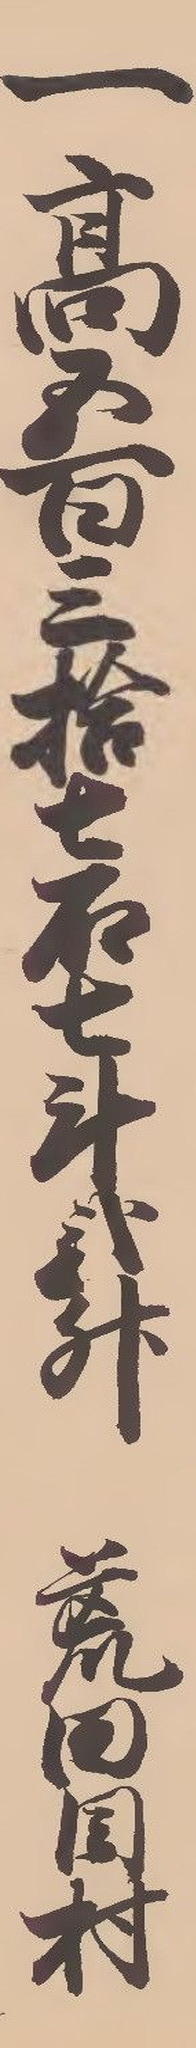一高五百三拾七石七斗弐升荒田目村
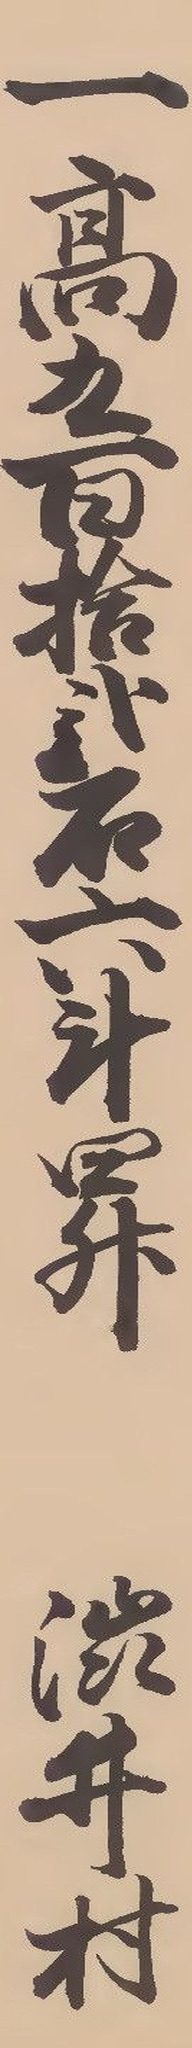一高九百拾弐石六斗四升渋井村
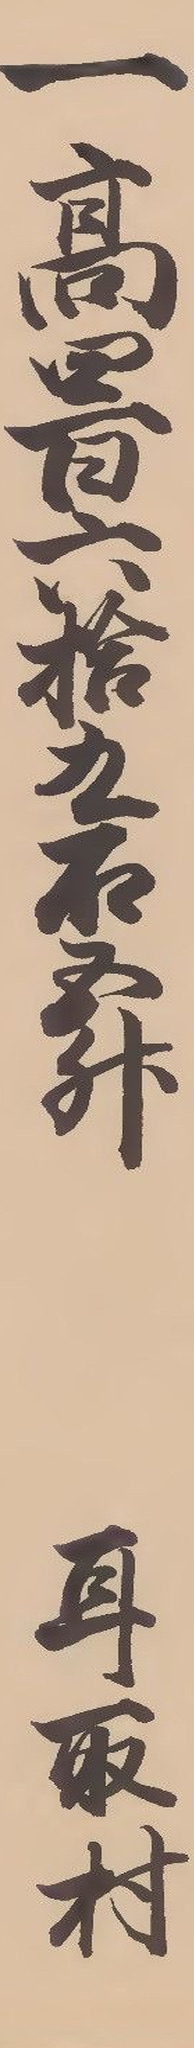一高四百六拾九石五升耳取村
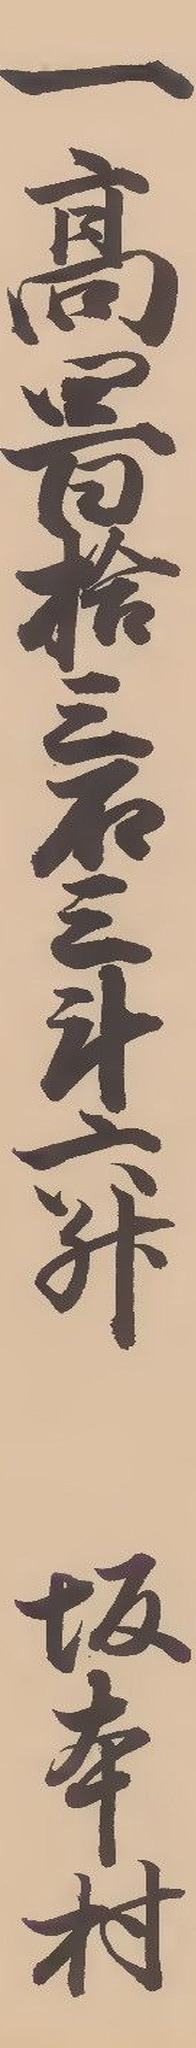一高四百拾三石三斗六升坂本村

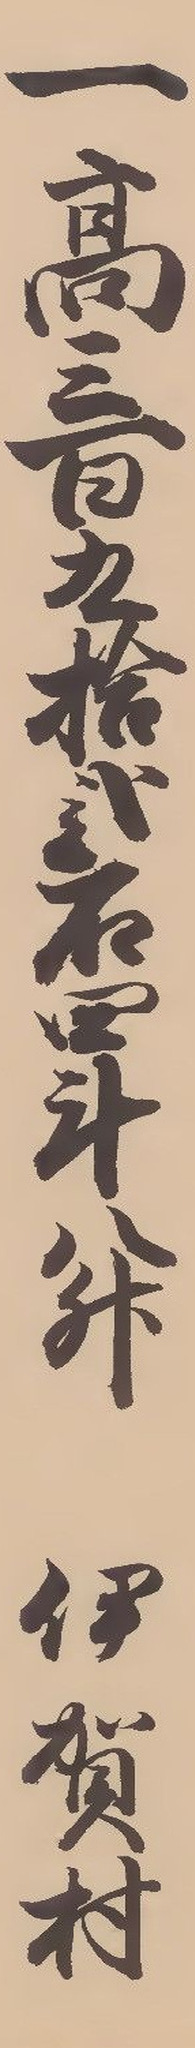一高三百九拾弐石四斗八升伊賀村
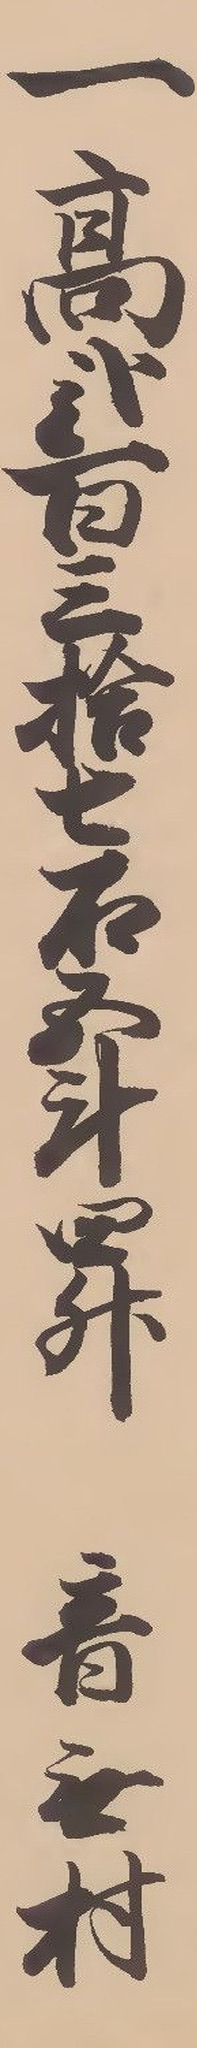一高弐百三拾七石五斗四升音無村
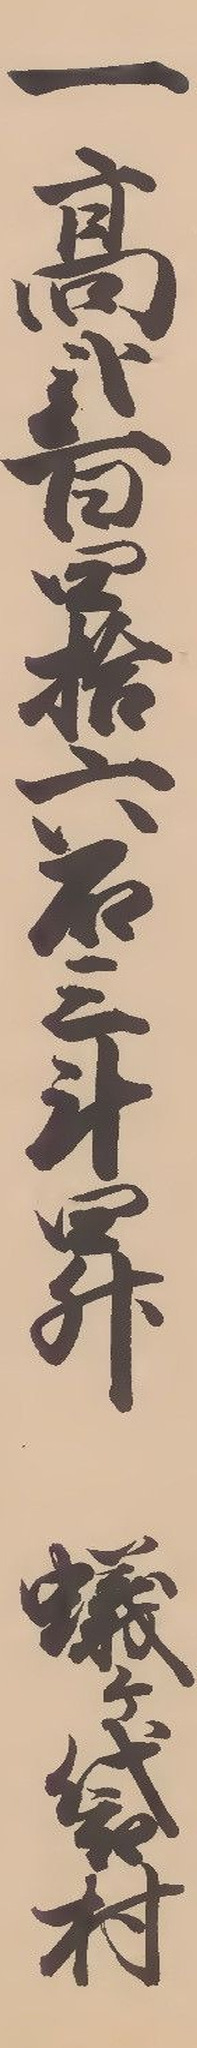一高弐百四拾六石三斗四升蟻ヶ袋村
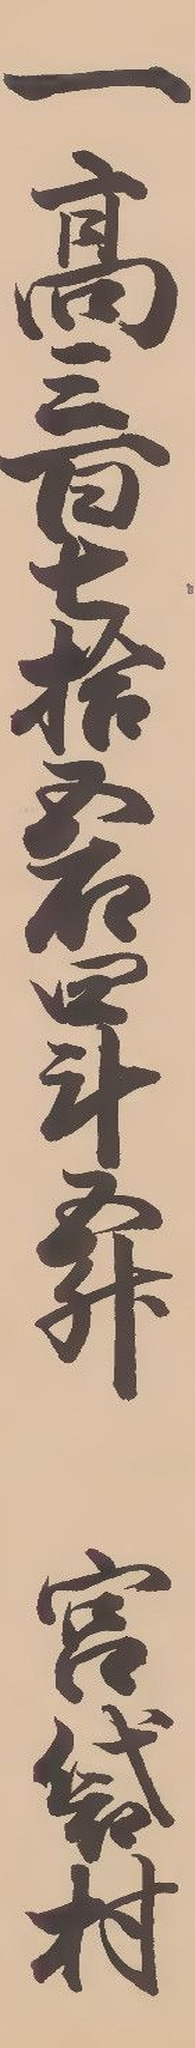一高三百七拾五石四斗五升宮袋村
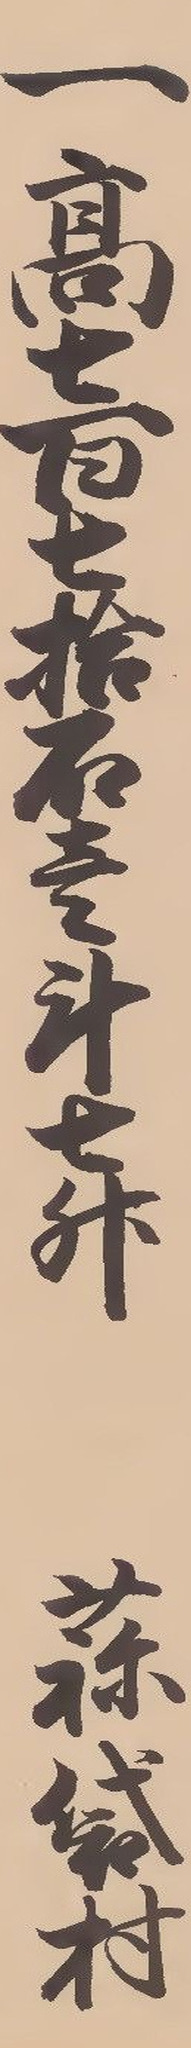一高七百七拾石壱斗七升蒜袋村
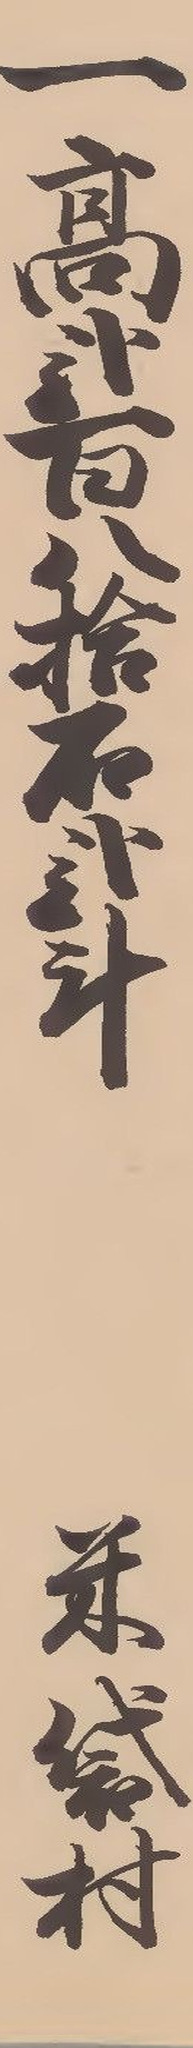一高弐百八拾石弐斗米袋村
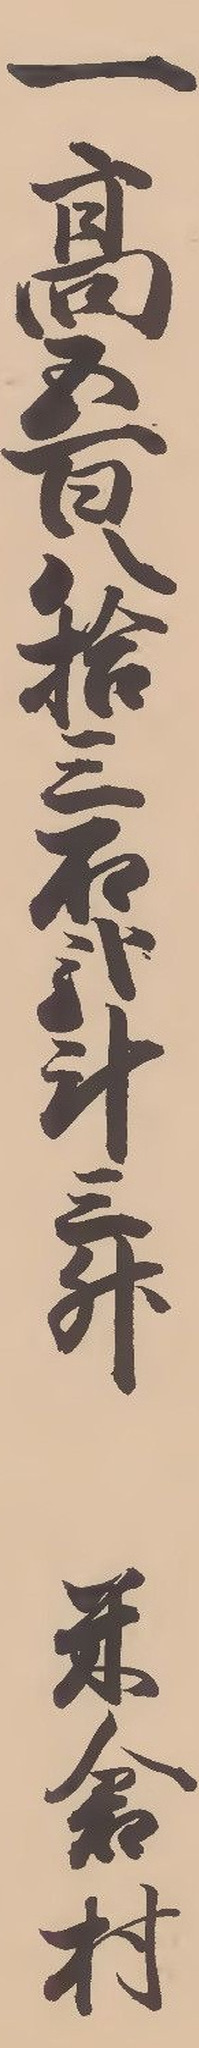一高五百八拾三石弐斗三升米倉村
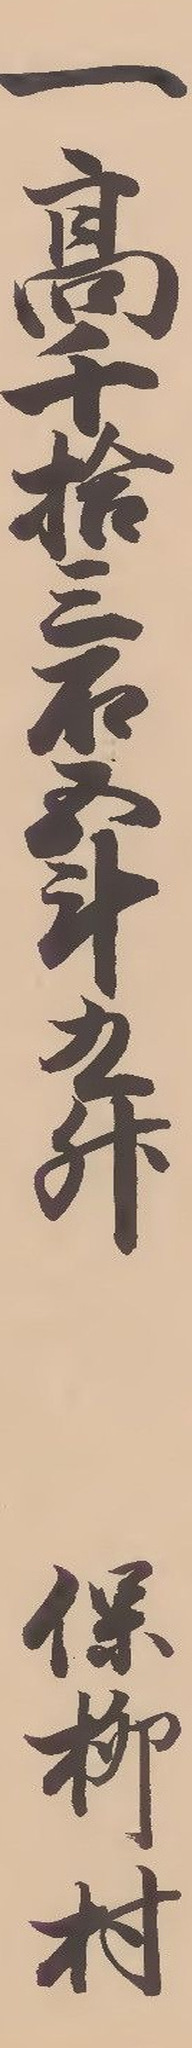一高千拾三石五斗九升保柳村

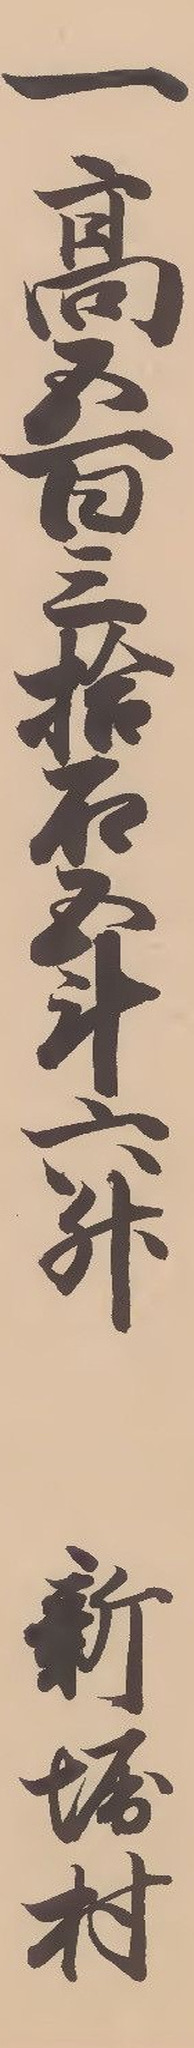一高五百三拾石五斗六升新堀村
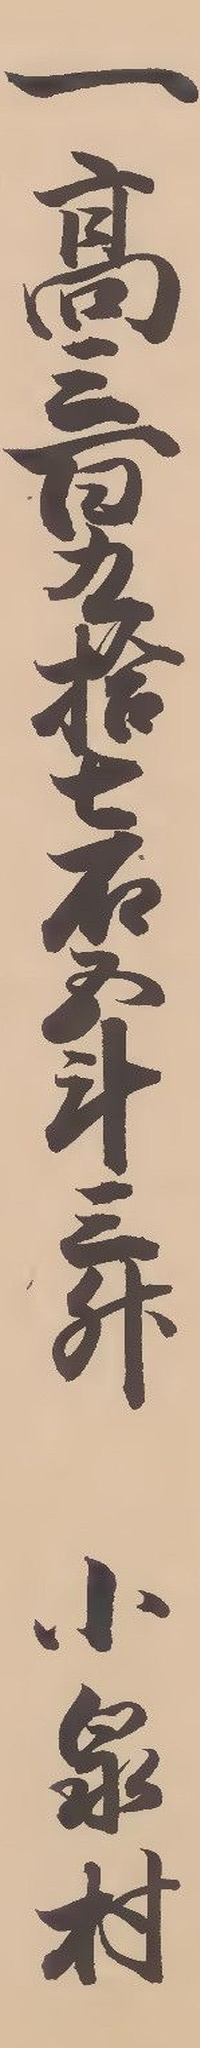一高三百九拾七石五斗三升小泉村
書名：陸奥国郷帳　５
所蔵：国立公文書館 National Archives of Japan
